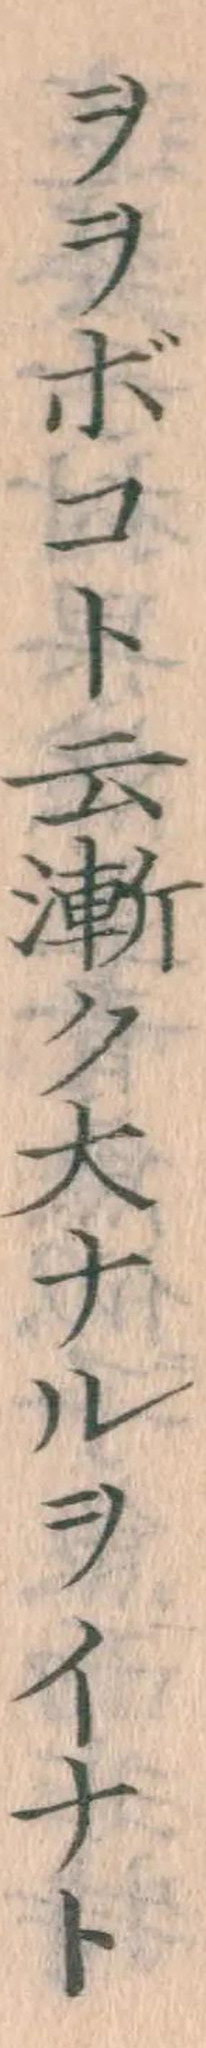ヲヲボコト云漸ク大ナルヲイナト
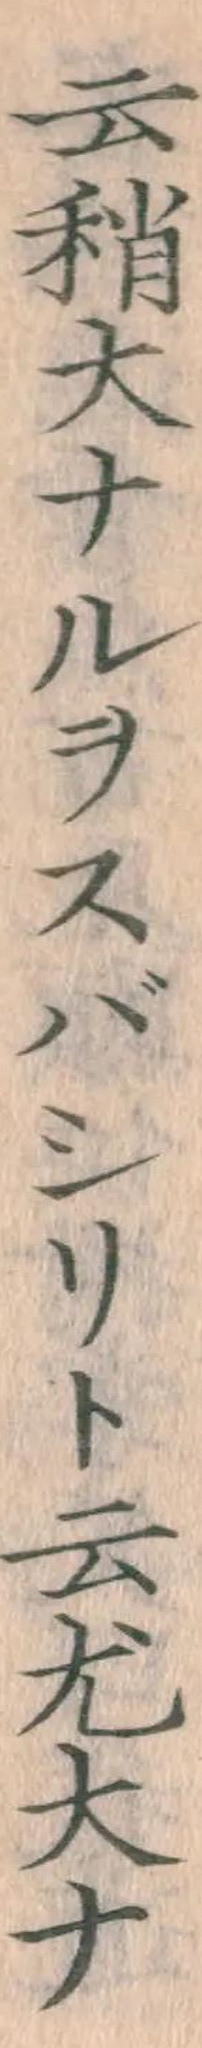云稍大ナルヲスバシリト云尤大ナ
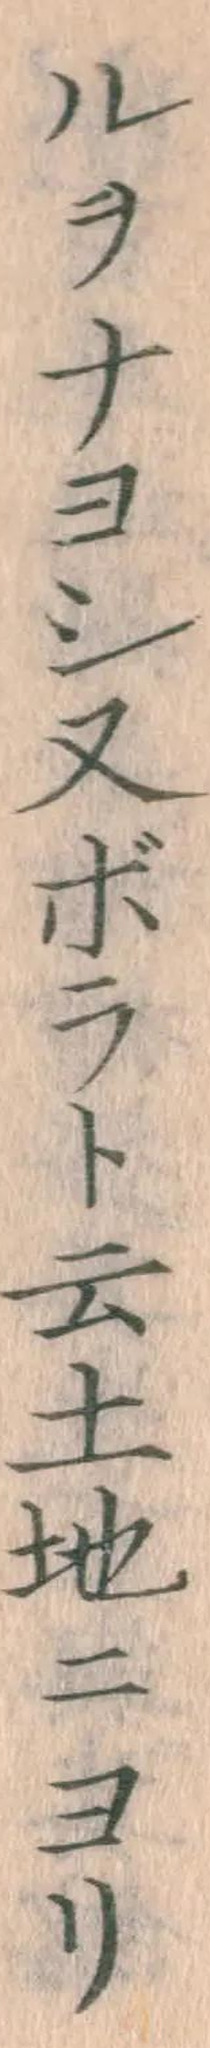ルヲナヨシ又ボラト云土地ニヨリ
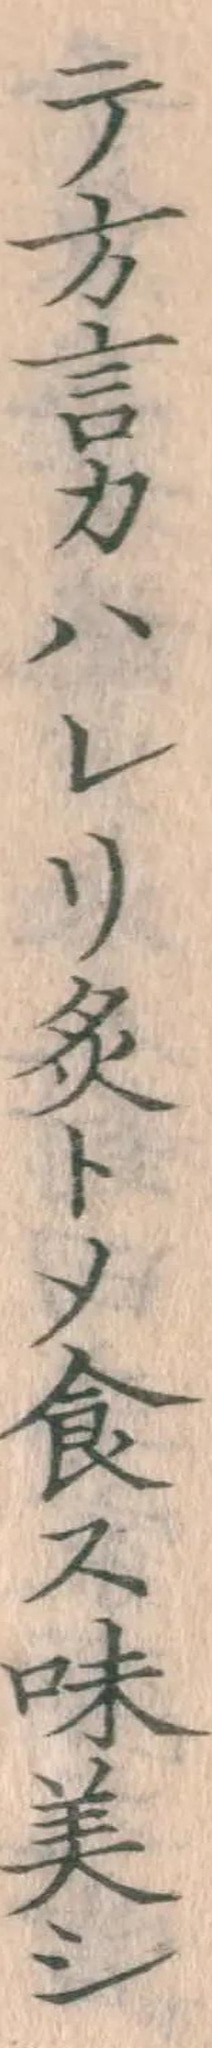テ方言カハレリ炙トシテ食ス味美シ
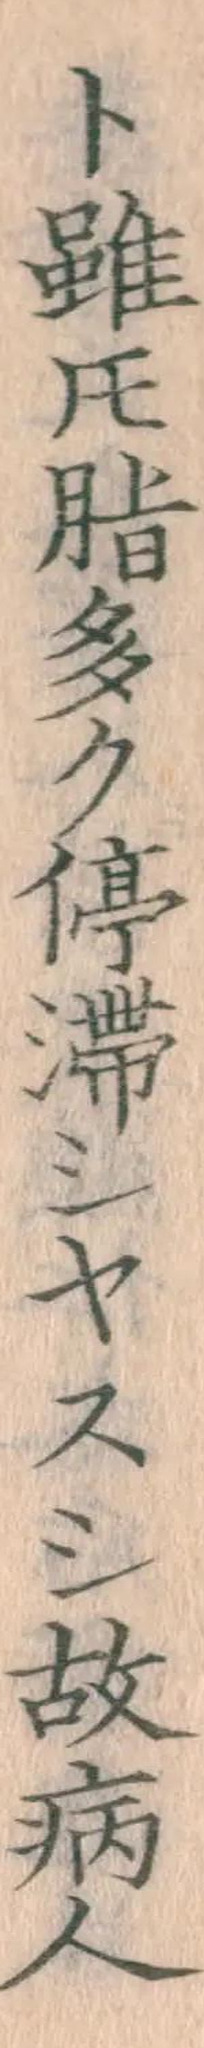ト雖トモ脂多ク停滞シヤスシ故病人
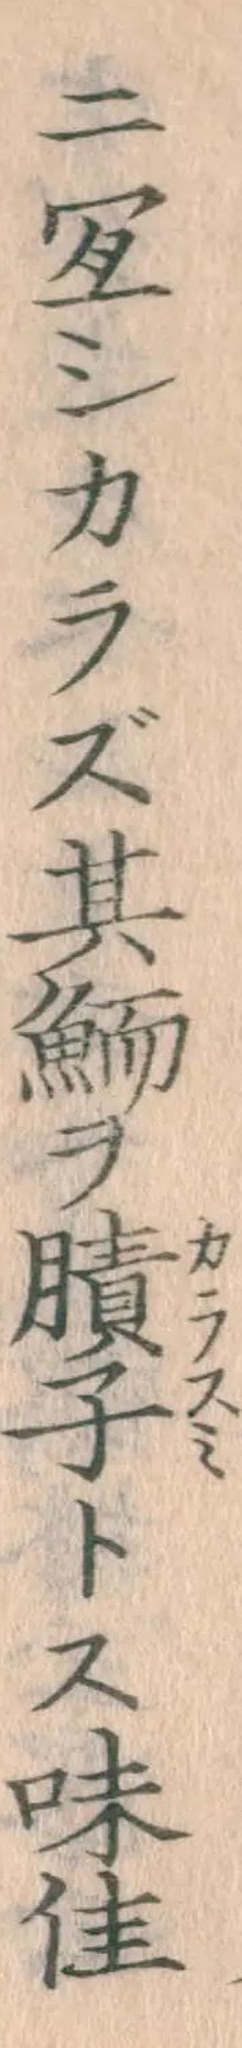ニ宜シカラズ其鮞ヲ瞔子トス味佳
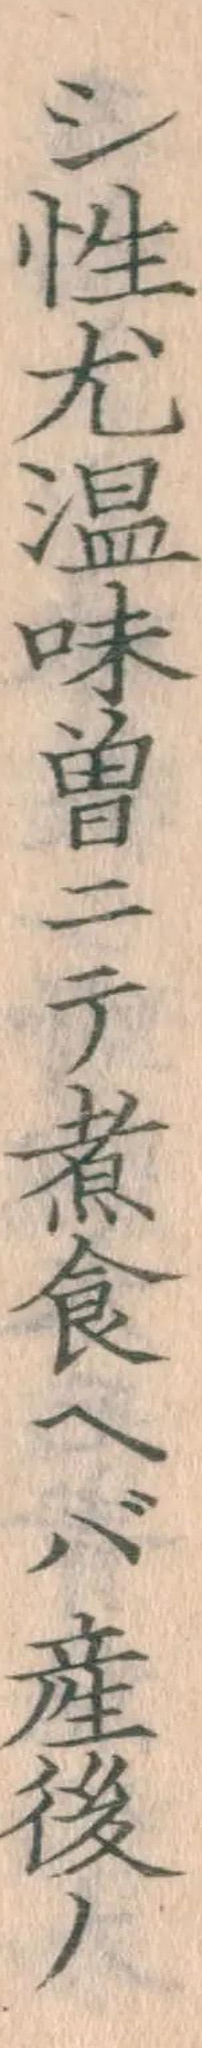シ性尤温味噌ニテ煮食ヘバ産後ノ
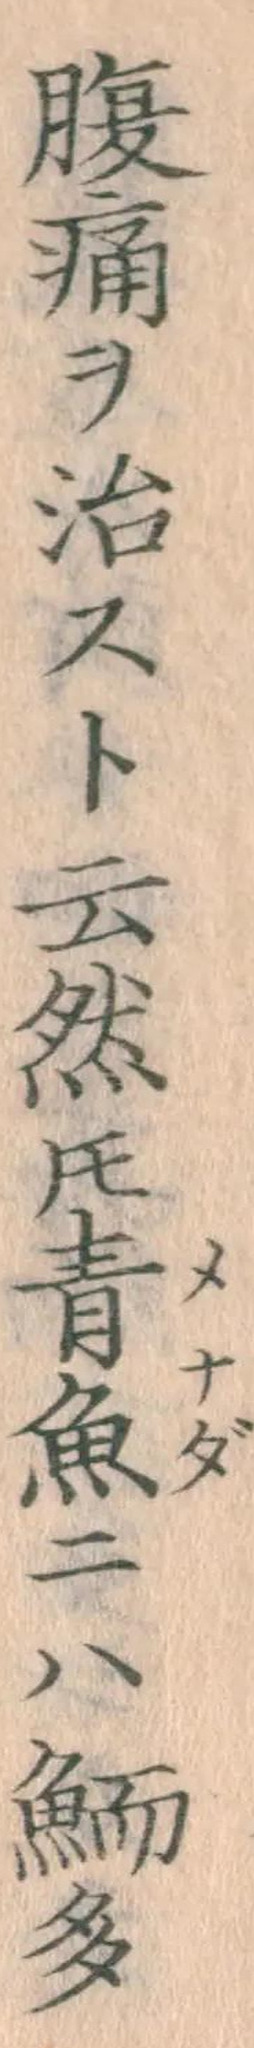腹痛ヲ治スト云然トモ青魚ニハ鮞多
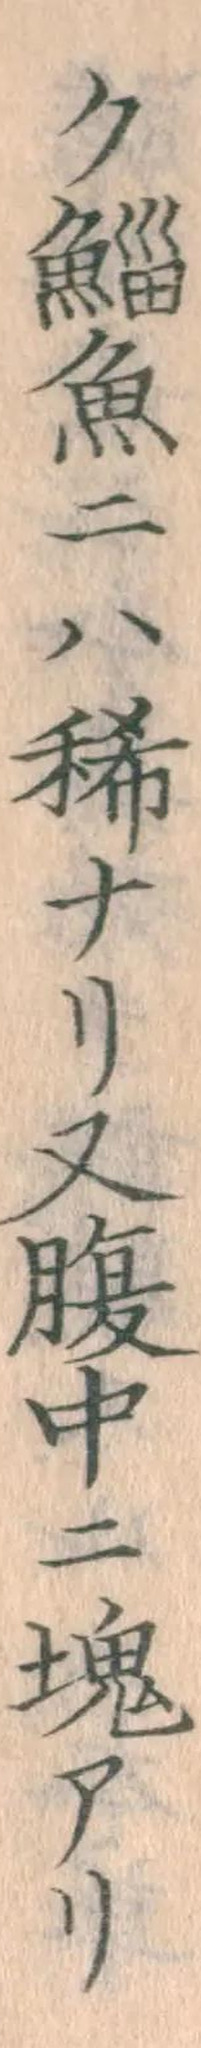ク鯔魚ニハ稀ナリ又腹中ニ塊アリ
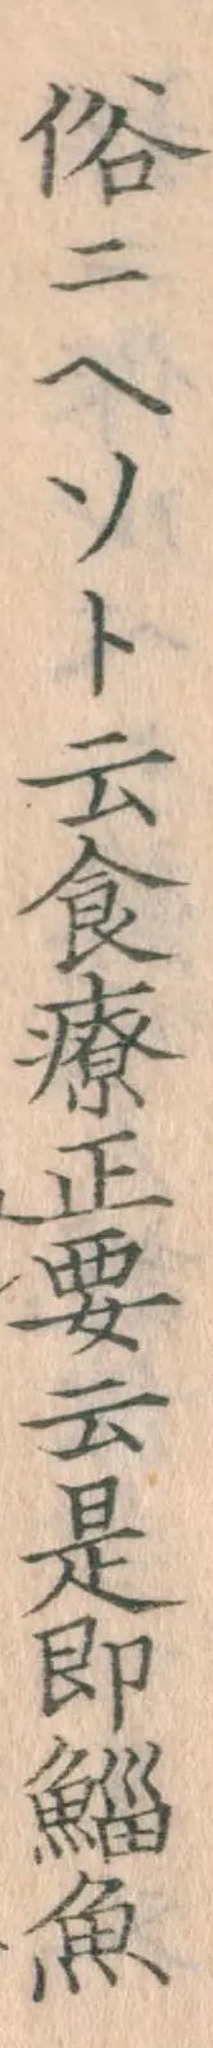俗ニヘソト云食療正要云是即鯔魚

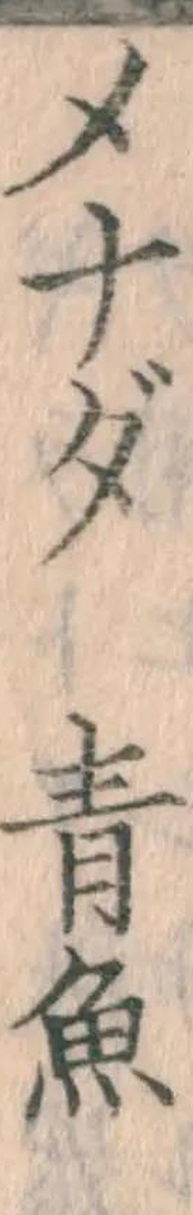メナダ青魚
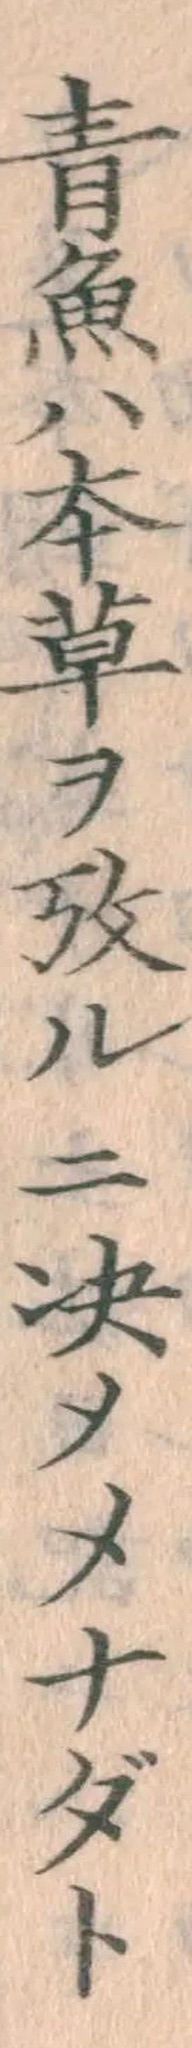青魚ハ本草ヲ攷ルニ決シテメナダト
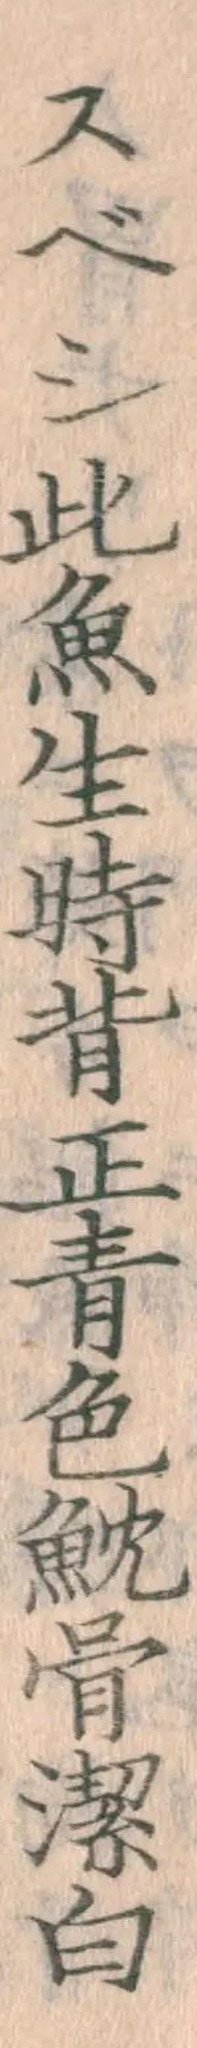スベシ此魚生時背正青色魫骨潔白
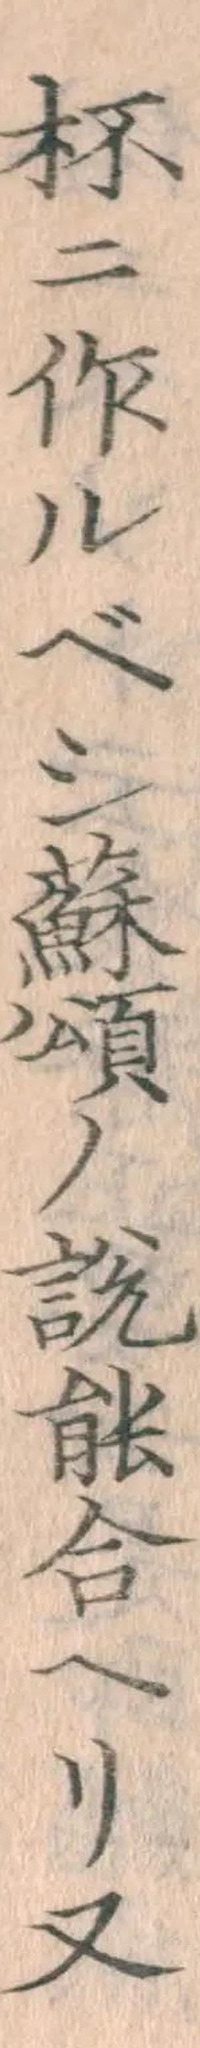杯ニ作ルベシ蘇頌ノ説能合ヘリ又
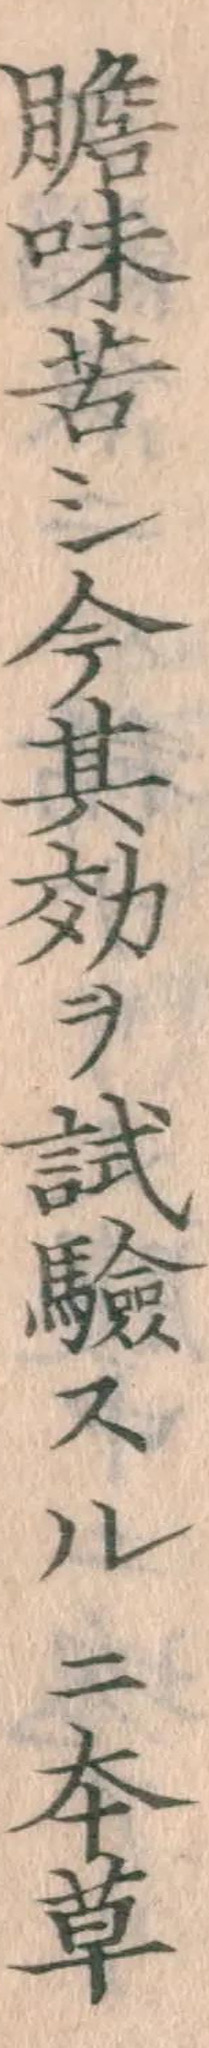胆味苦シ今其効ヲ試験スルニ本草
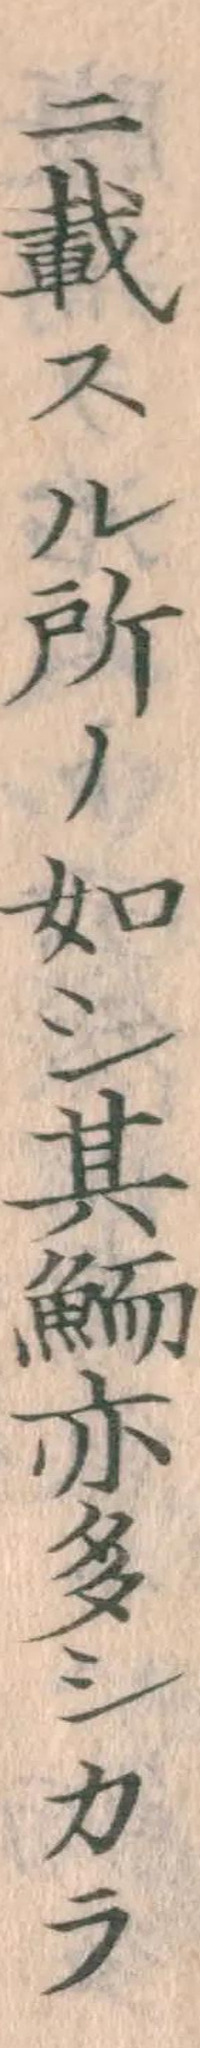ニ載スル所ノ如シ其鮞亦多シカラ
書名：皇和魚譜 2巻
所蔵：国立国会図書館 National Diet Library, JAPAN
